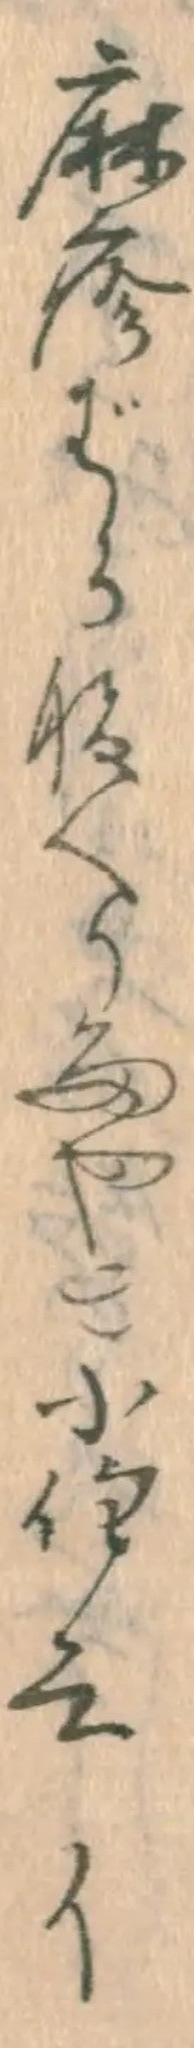麻疹ばら腹へりたやと小僧云い
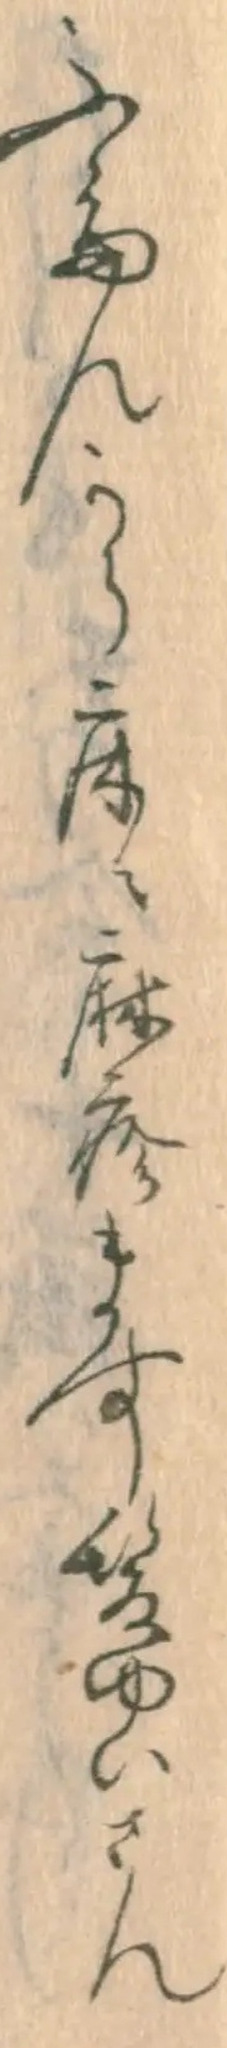ふたんから床に麻疹ます髪ゆいさん
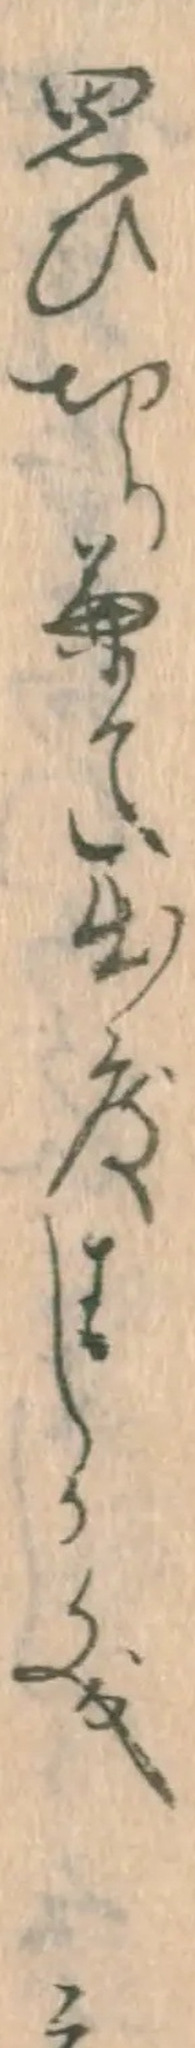思ひ切り兼てい出度はしか文
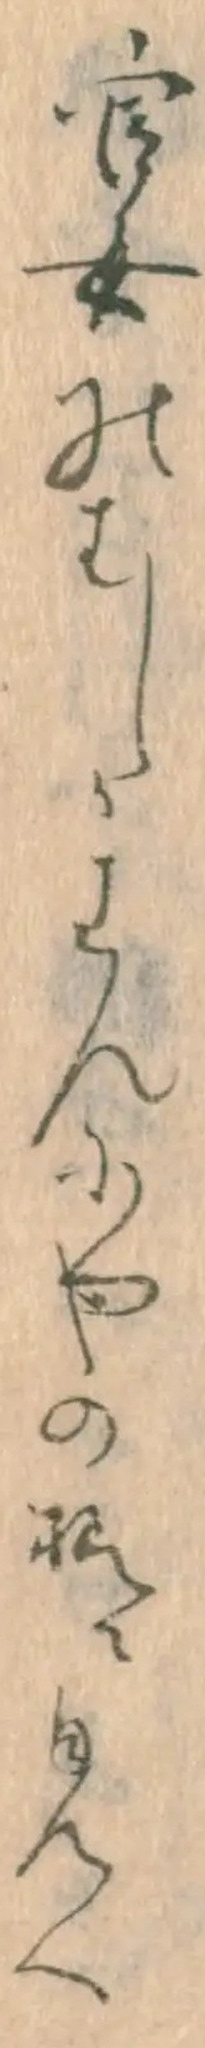官女のはしかはんにゃの？に見へ
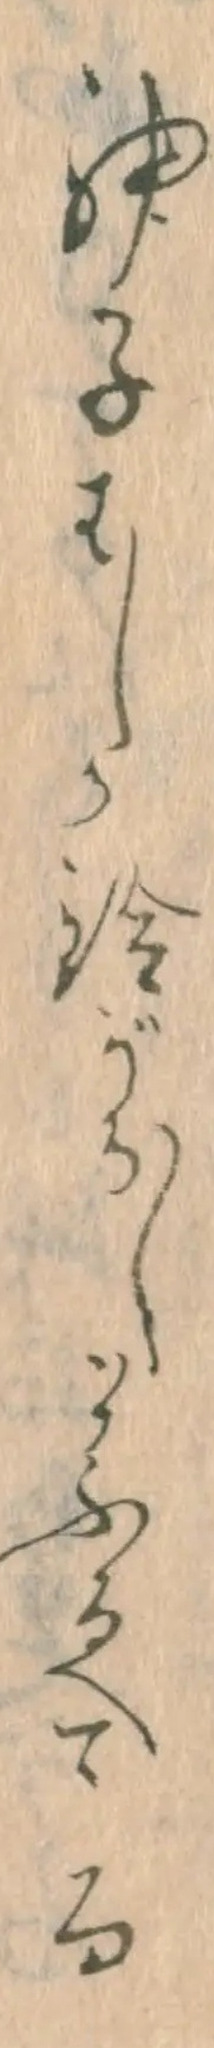神子はしか鈴がらがらとふるへてる
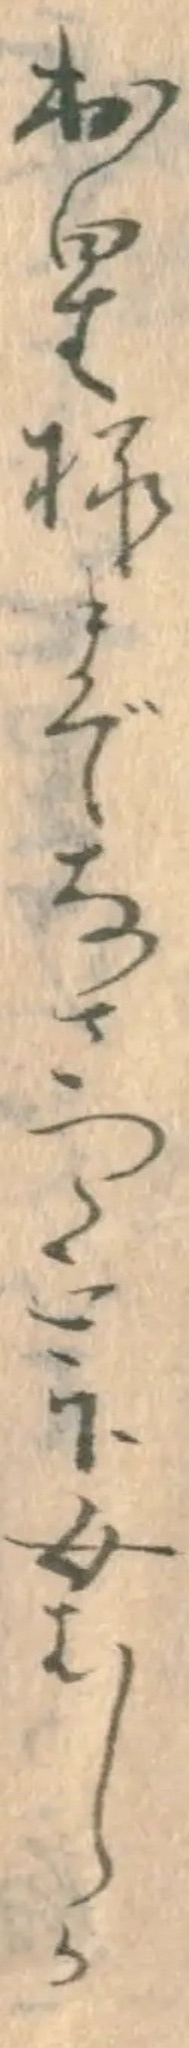お星様までなさったと下女はしか
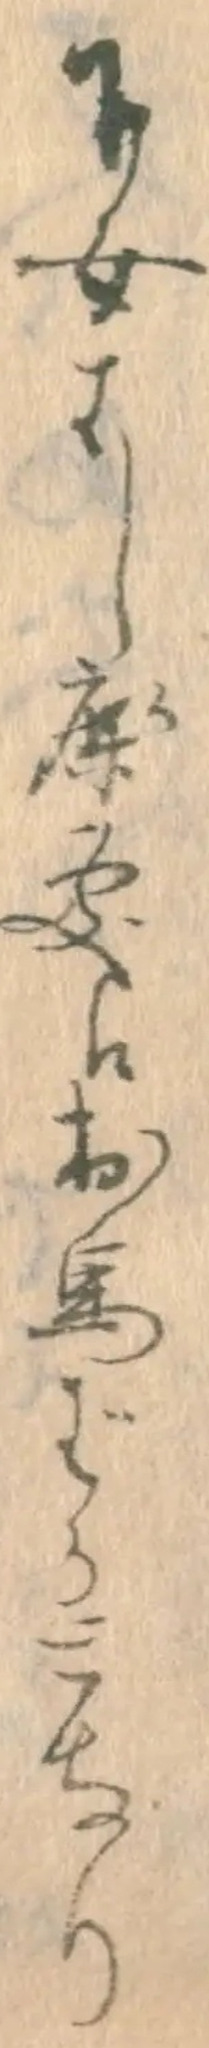下女はしか廉処えお馬ばらとなり
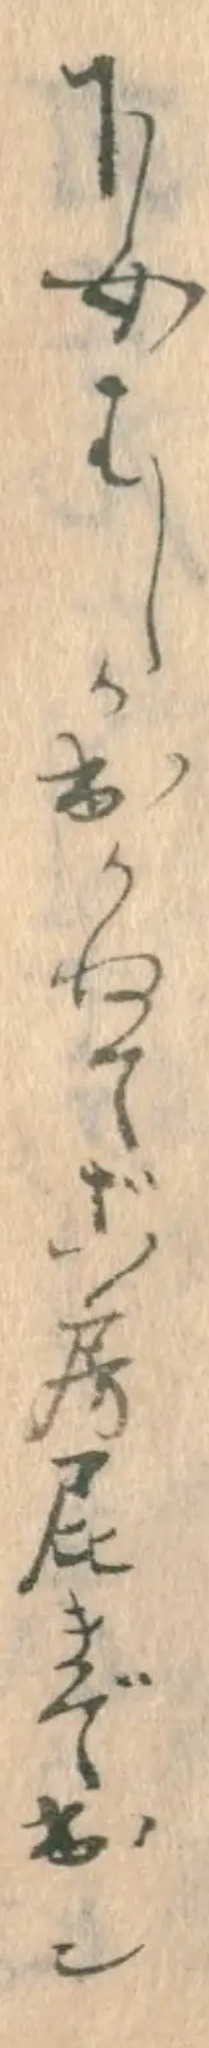下女はしか出かねてご房屁まで出し
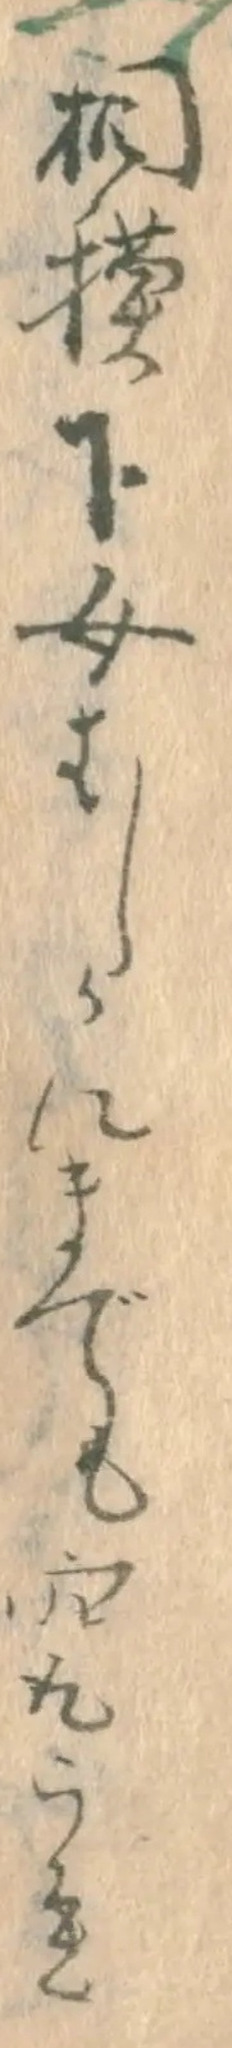相模下女はしかにまでも穴取られ
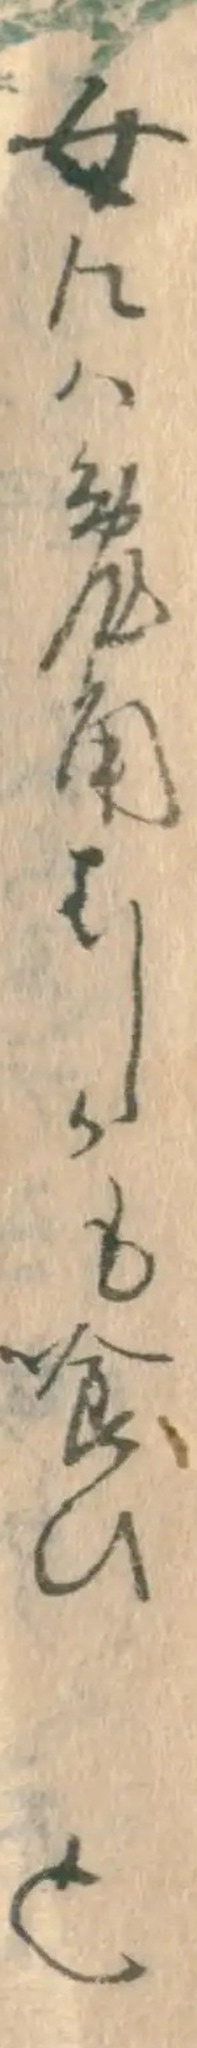女には兎角はしかも喰ひ込

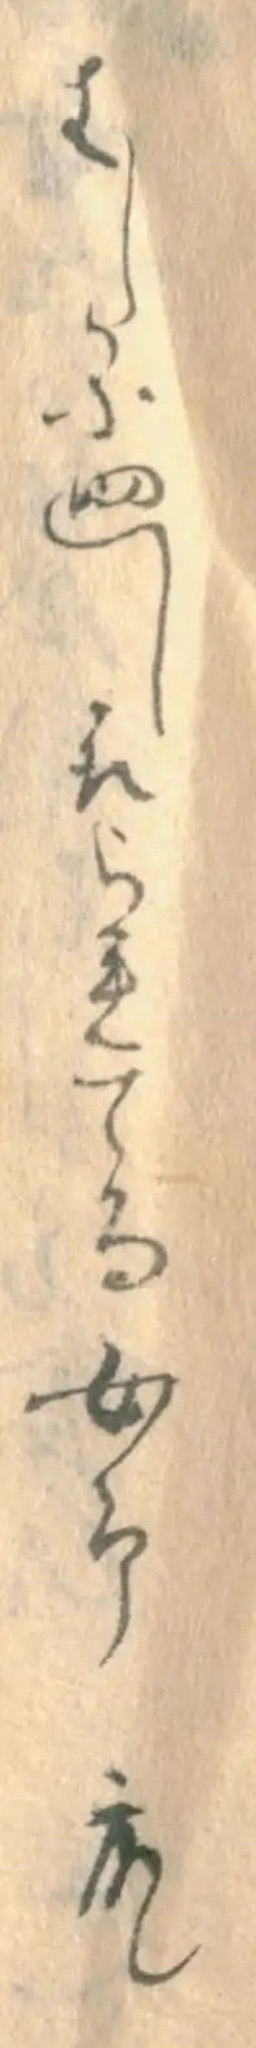はしかに廻し取られてる女郎衆
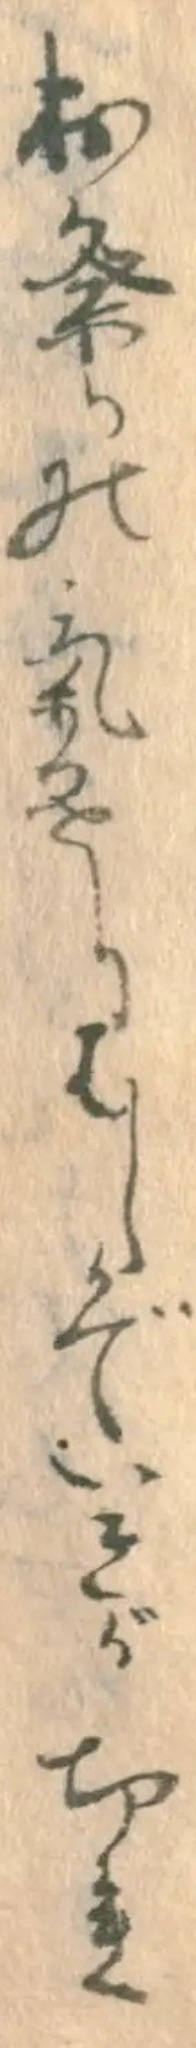お祭りの気遣りはしかでいきが切れ
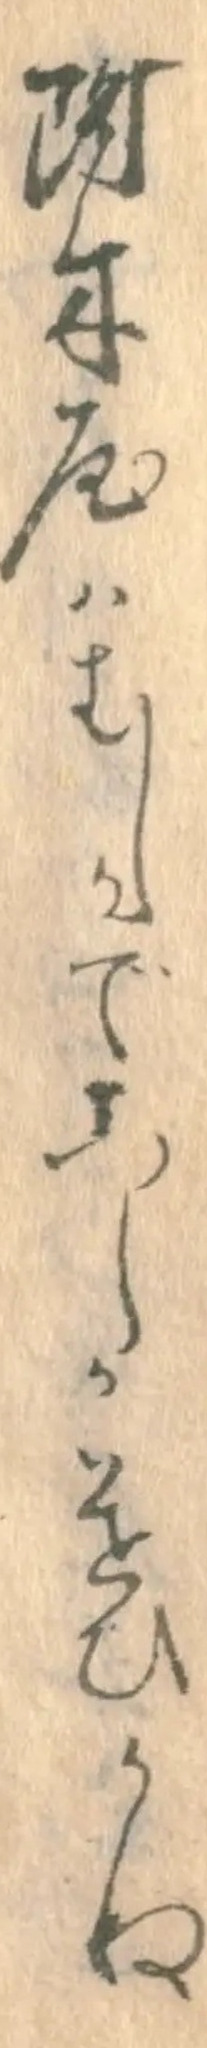附木屋ははしかでこしか遣ひかね
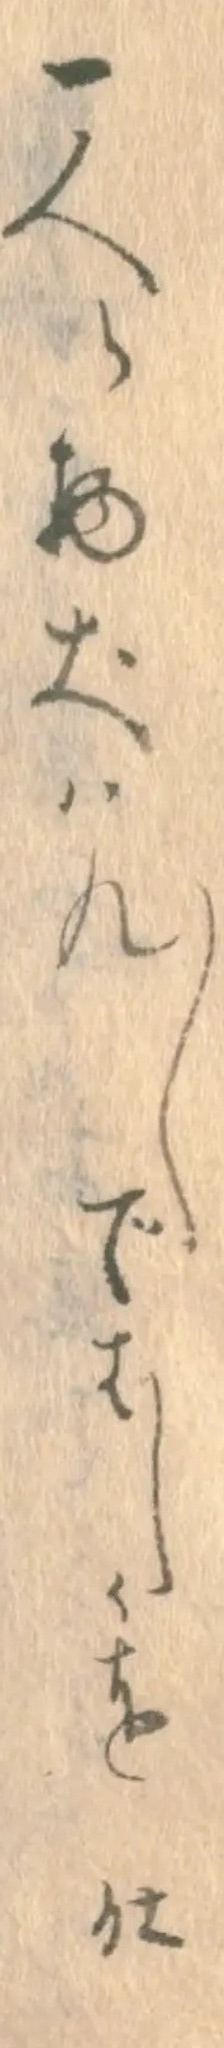一人リ物丈はれはれではしかを仕
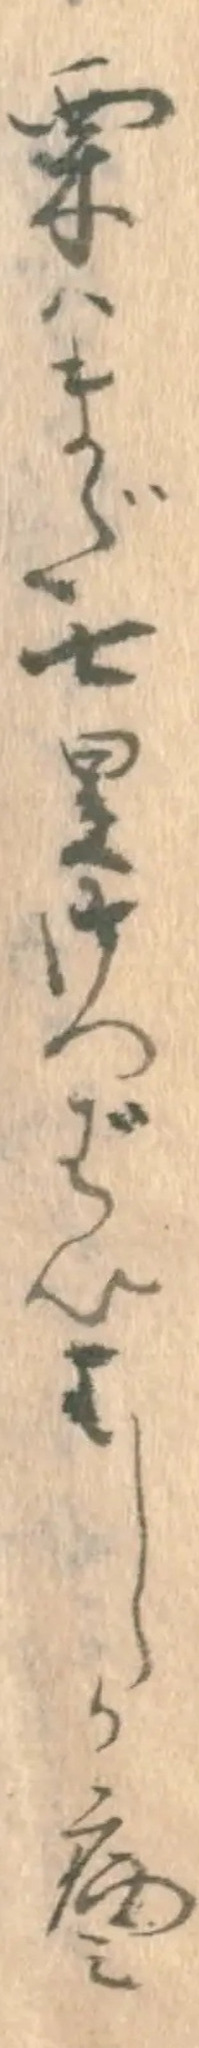栗はまだ七里けつばいはしか病み
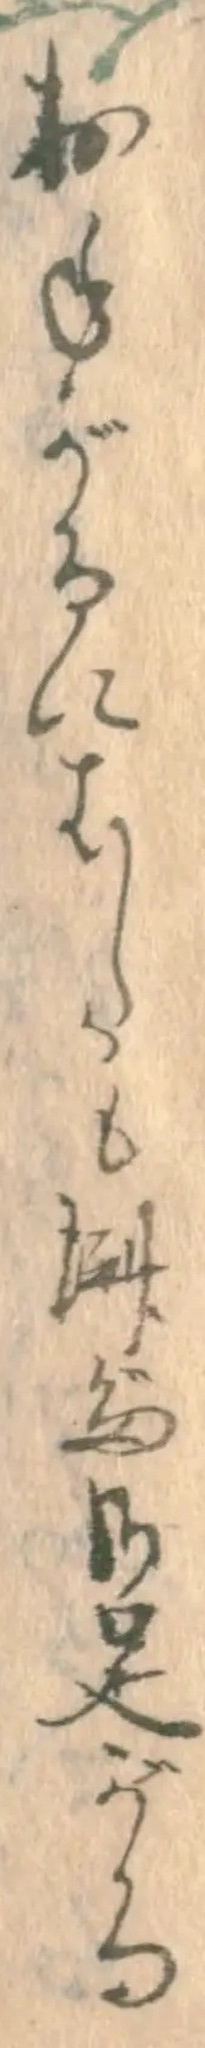お手がるにはしかも済だお足がる
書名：麻疹後柳樽
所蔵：国立国会図書館 National Diet Library, JAPAN
